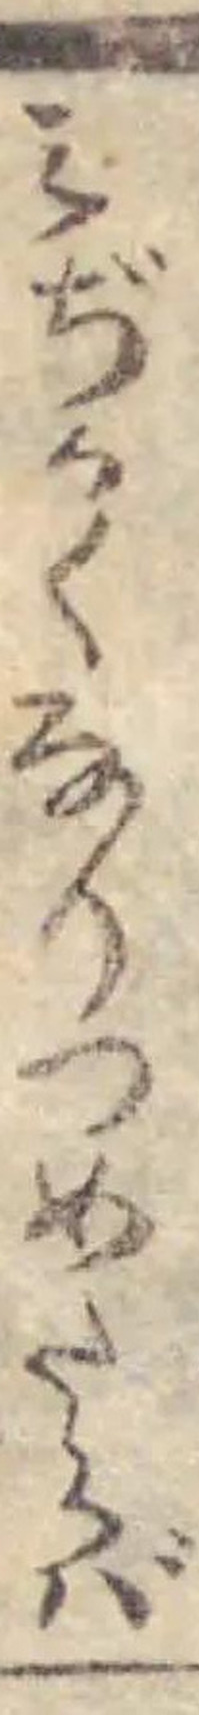みぢかくなりつめたらば
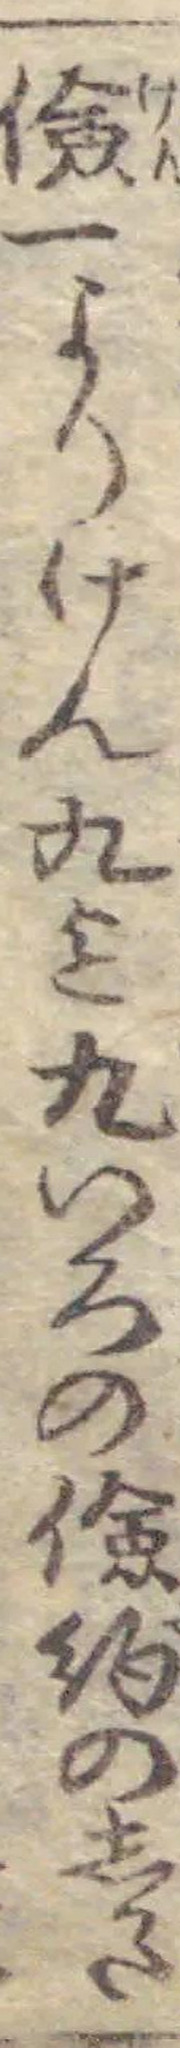倹一よりけん九を九いろの倹約のしかた
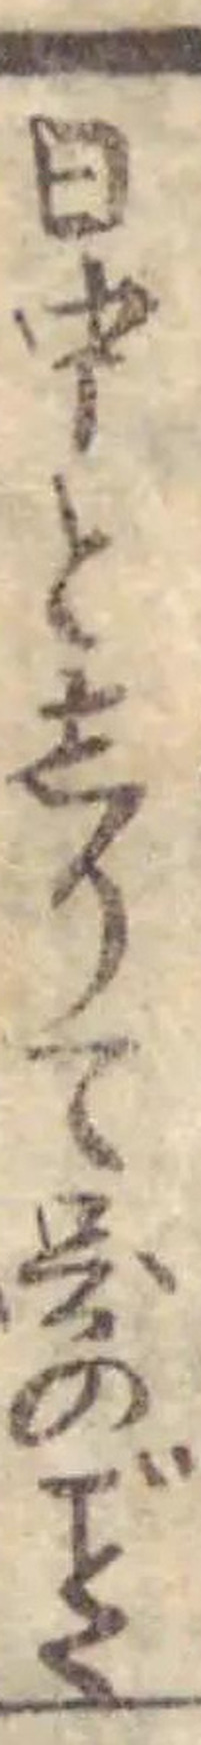日中としりて図のごとく
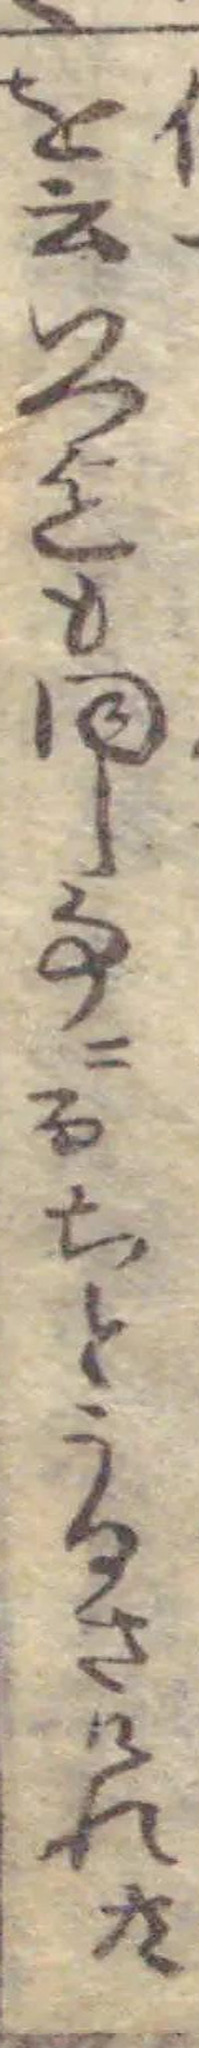を云いつ迄も同し事にてちとうるさけれ共

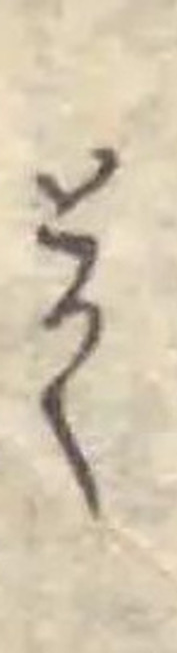とかく
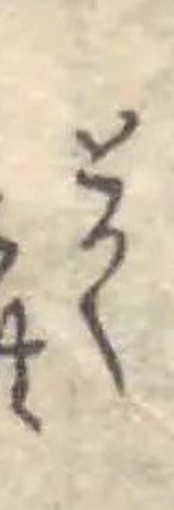とかく
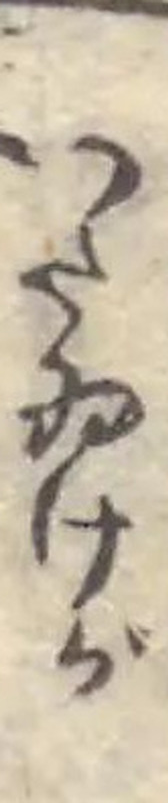いたゐけが
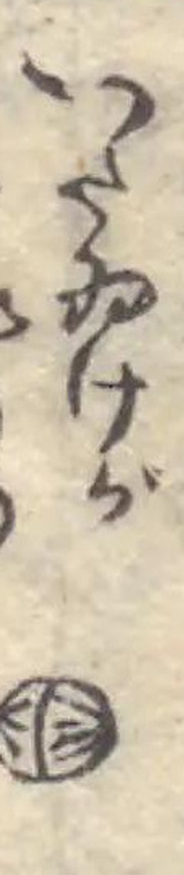いたゐけが
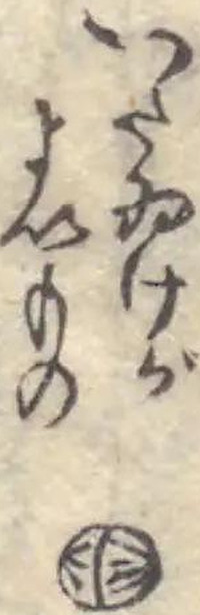よいもの
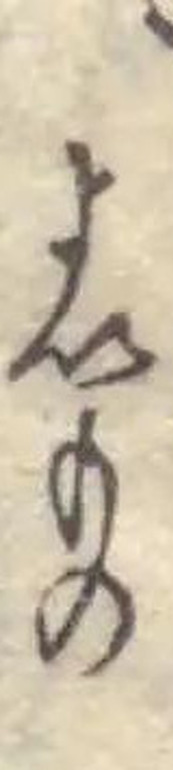よいもの
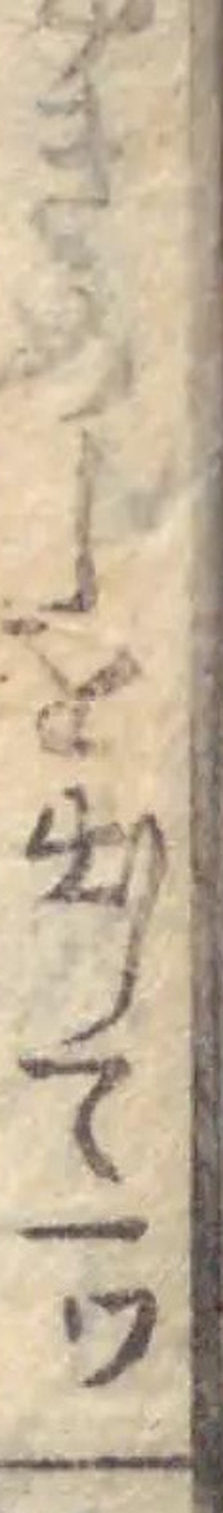やきめしを出して一つ
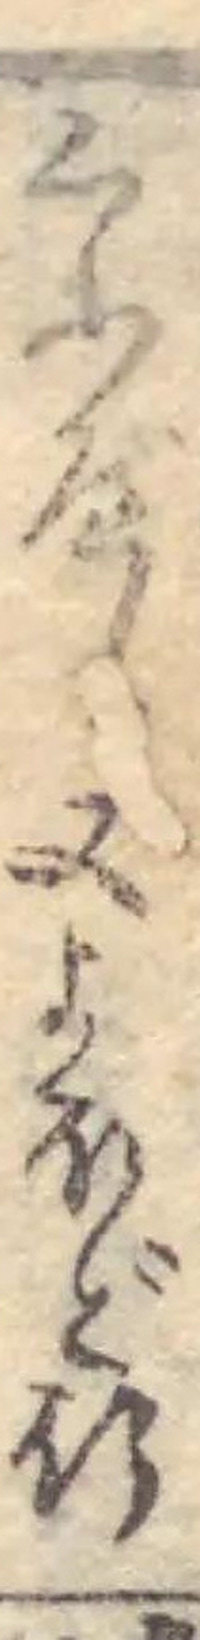くふべし又よほど行
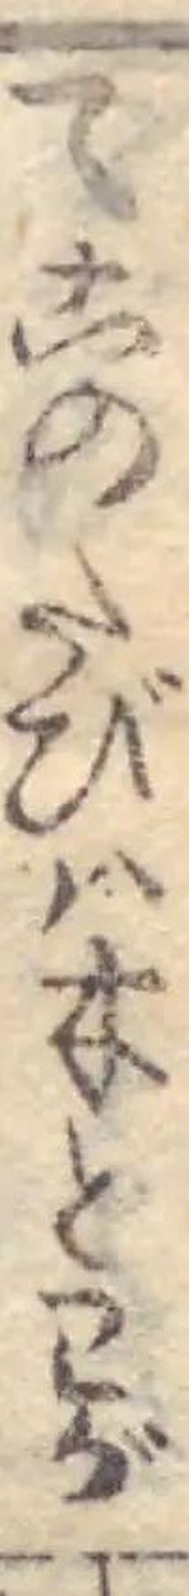てこのたびは木とわが
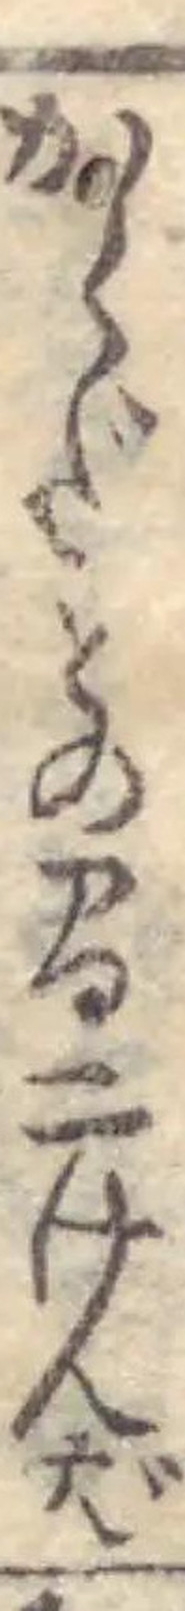からだとの間二けんば
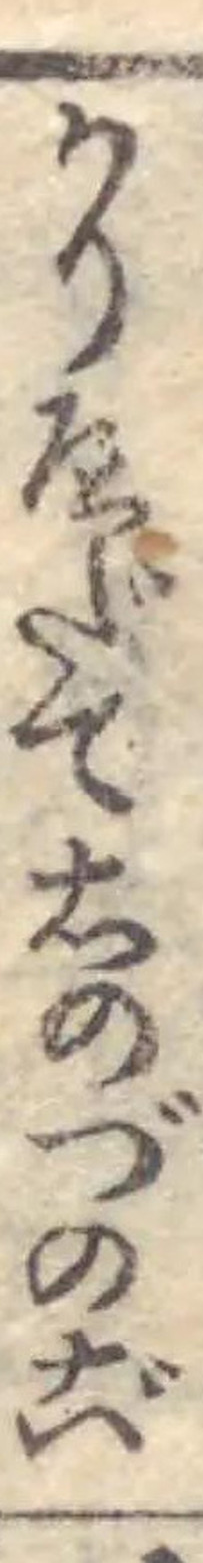かりへだて右のづのご
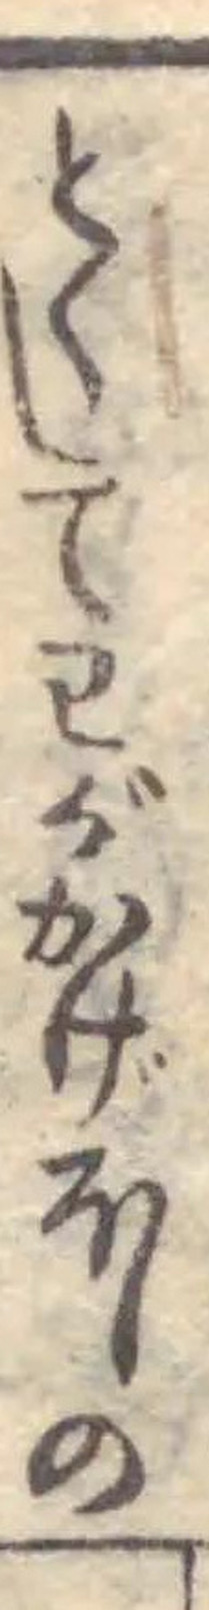とくしてわがかげほしの
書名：大通人好記
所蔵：国立国会図書館 National Diet Library, JAPAN
